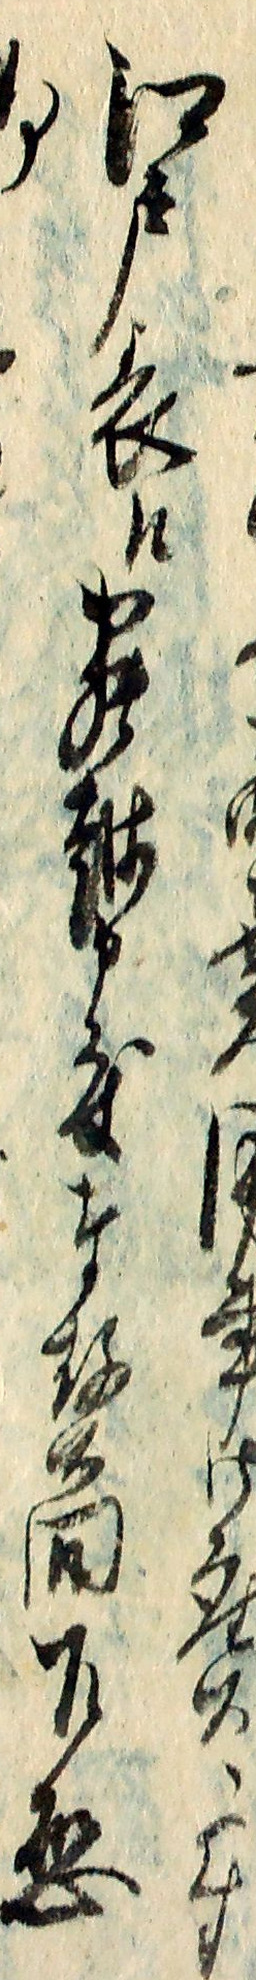江戸表え罷越度奉存候間乍恐
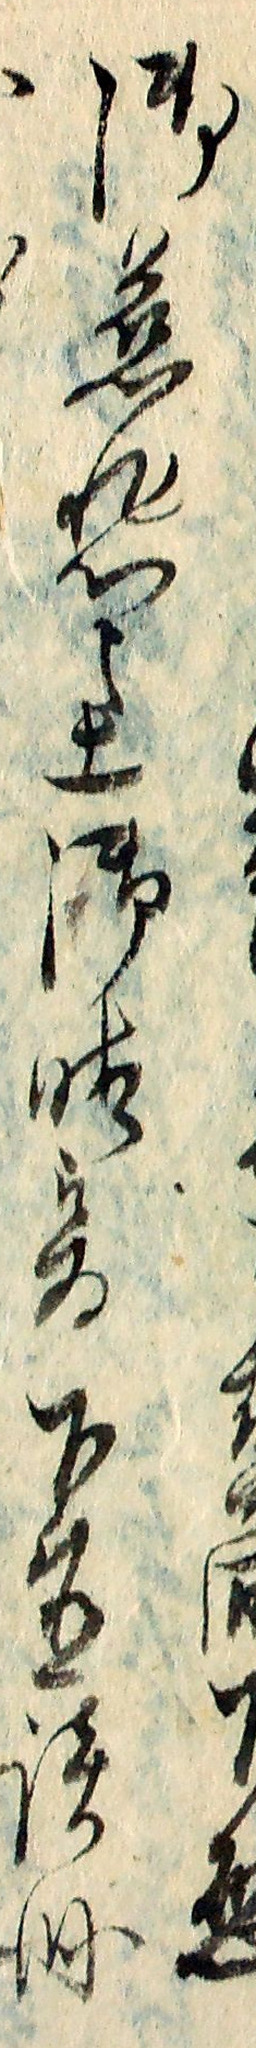御慈悲之上御暇被為下置淡州
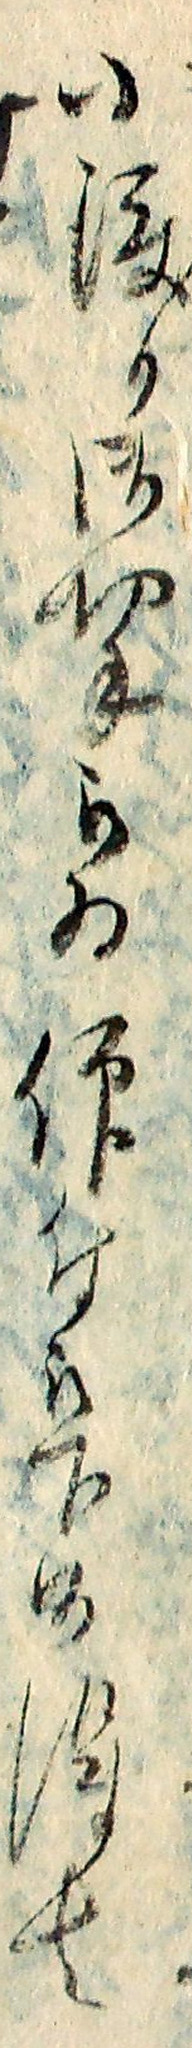小渡り御切手被為仰付被下候得は
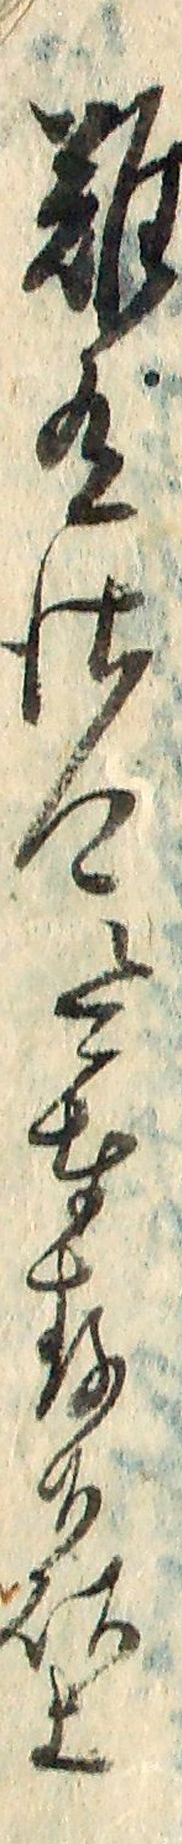難有仕合に可奉存候以上

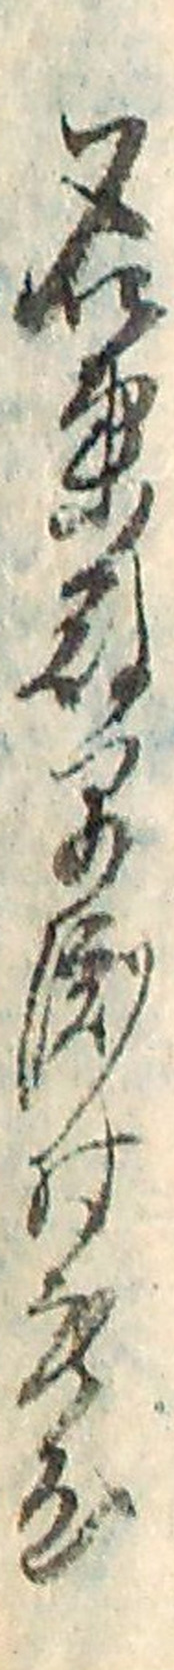名東郡早淵村庄屋
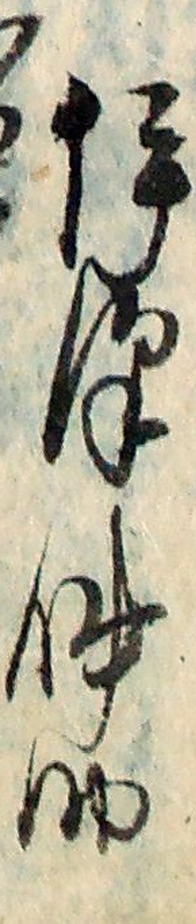伊沢仲助
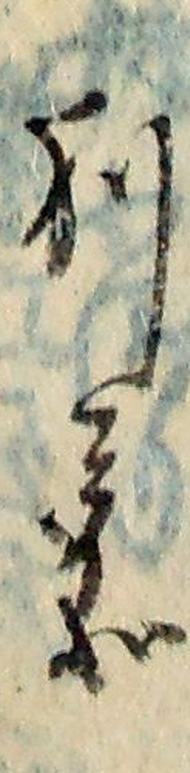利兵衛
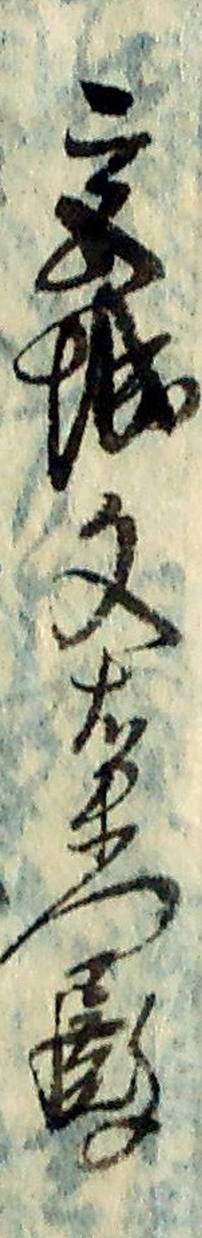宮城文右衛門殿
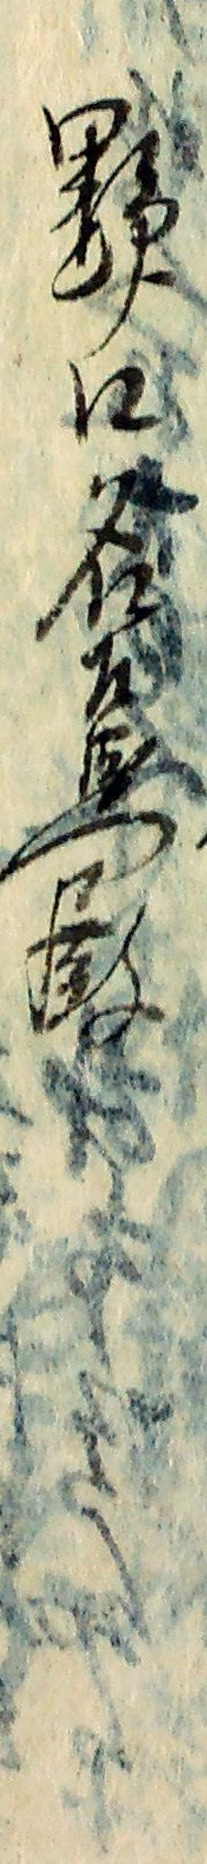野口名左衛門殿
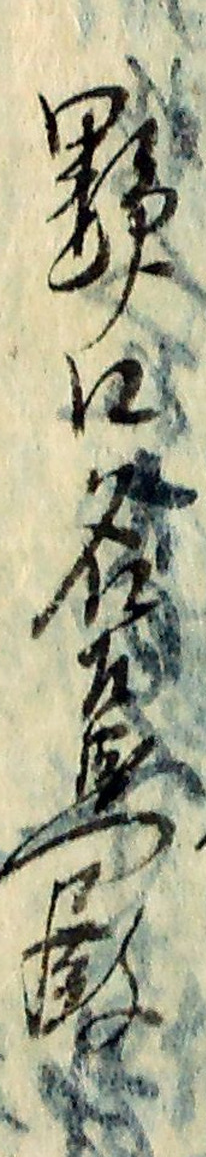野口名左衛門殿
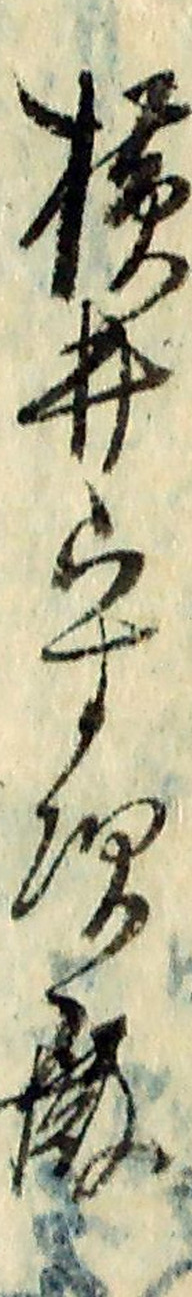横井守次殿
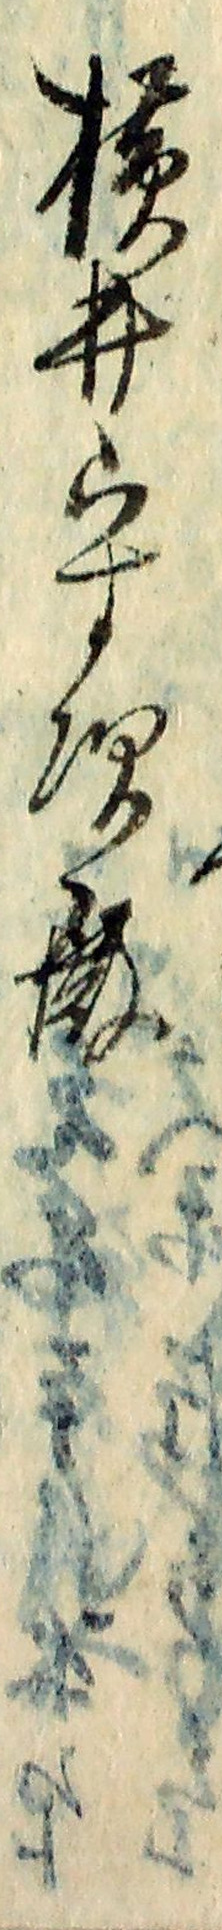横井守次殿
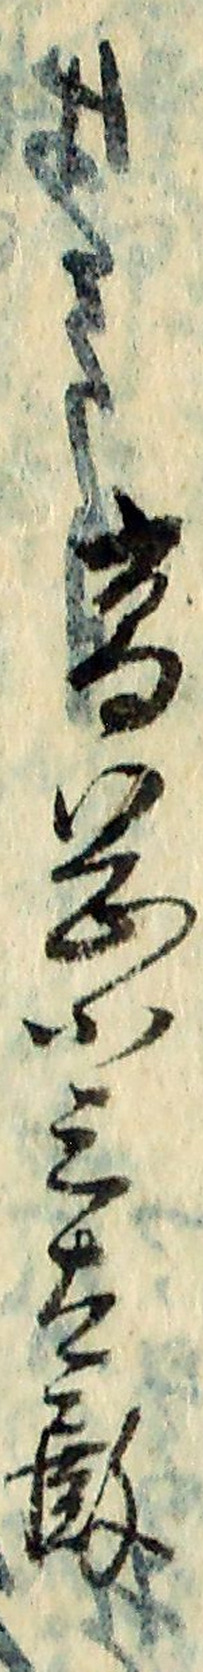高岡小三太殿

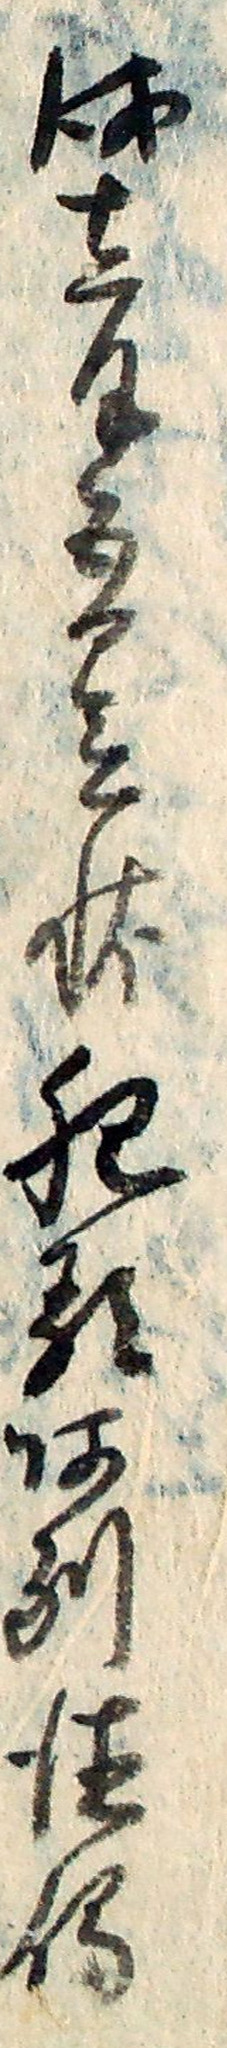戌十二月五日書状肥類阿州徳島
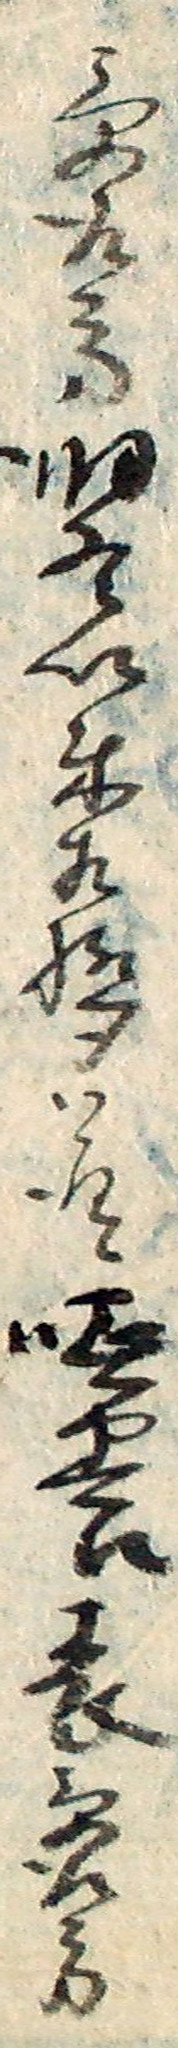受取方旧冬以来相極め御座候嘸養表受取方
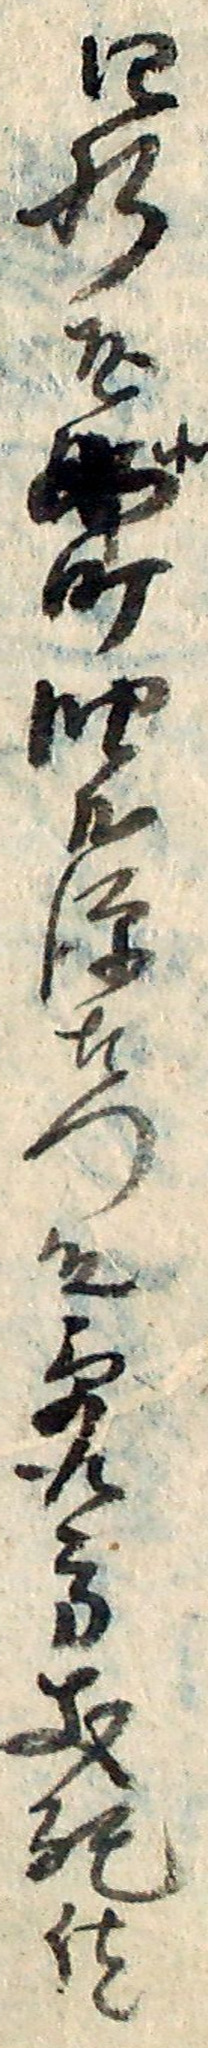四軒屋北町野尻源左衛門殿受取方支配仕候
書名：諸御願書控(後藤氏壱番）
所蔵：鳴門教育大学 Naruto University of Education
